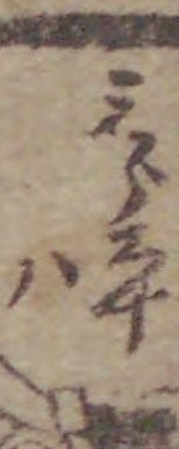三郎平
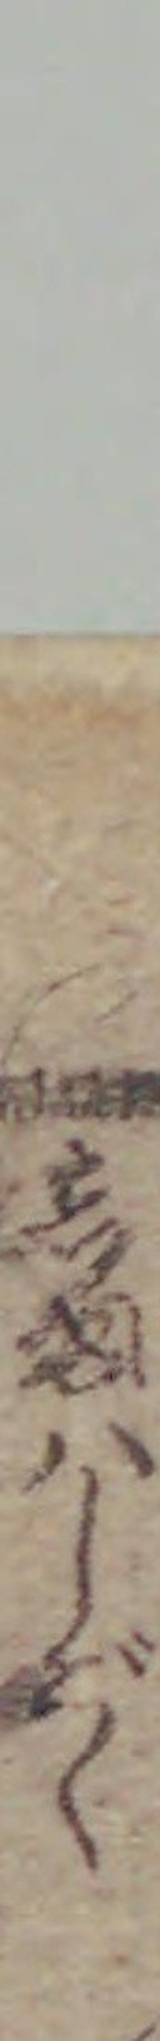しまはしごく
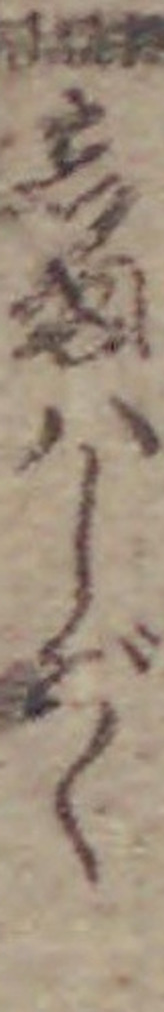しまはしごく
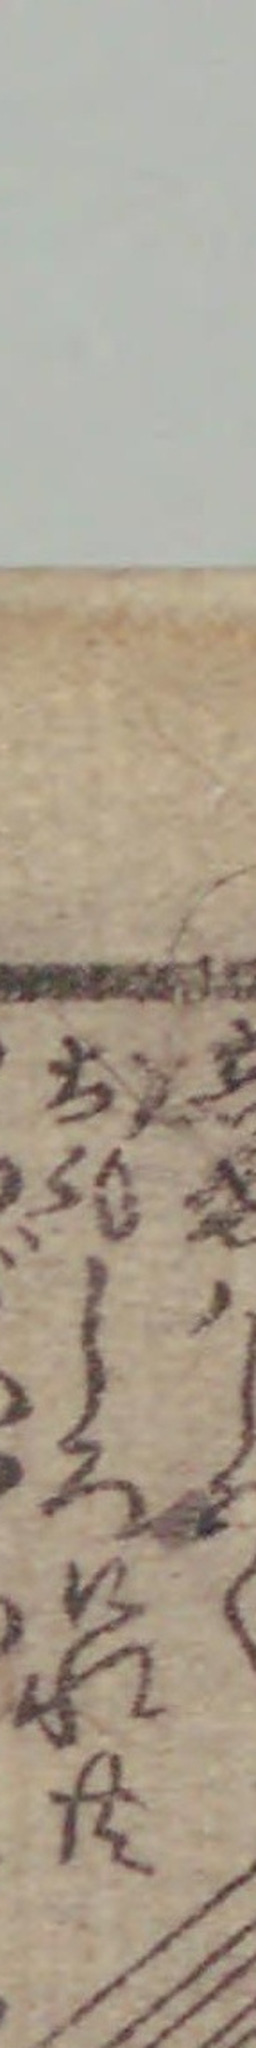おもしろけれ共
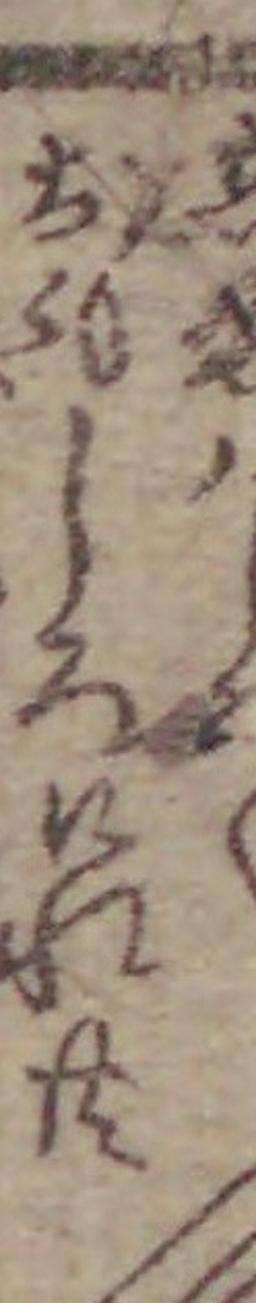おもしろけれ共
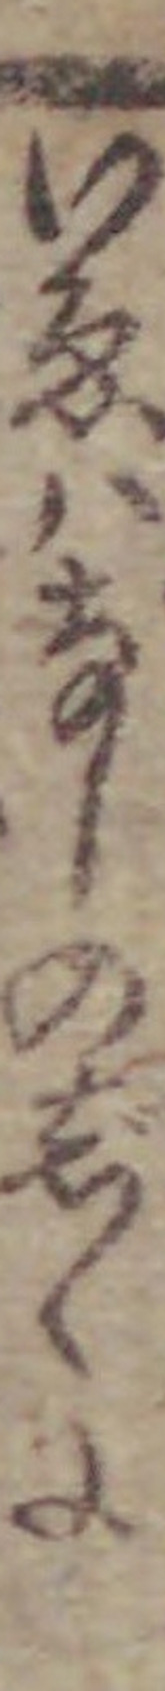いゑはなしのじくに
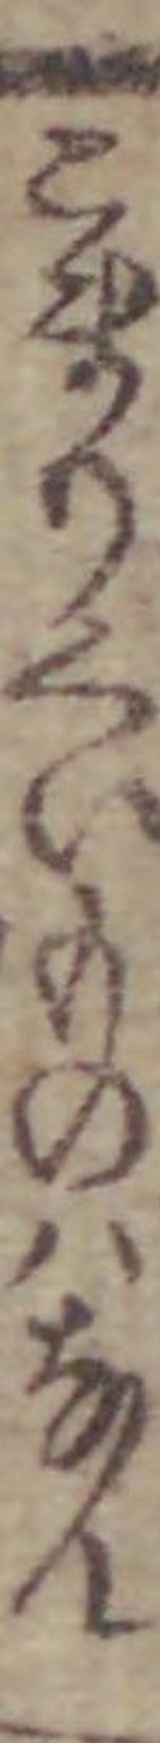こまりくいものはなん
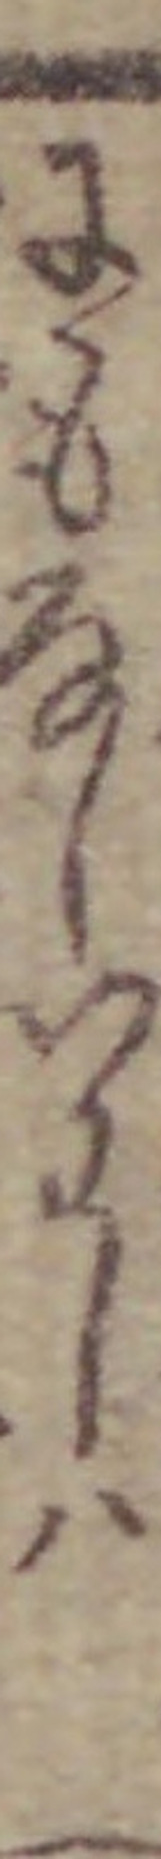にもなしいわしは
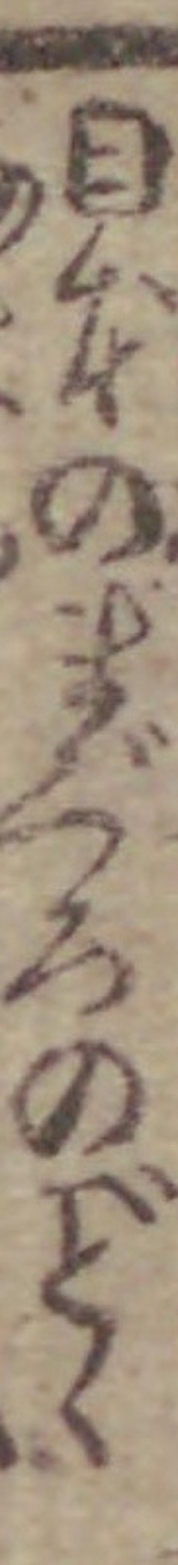日本のまぐろのごとく
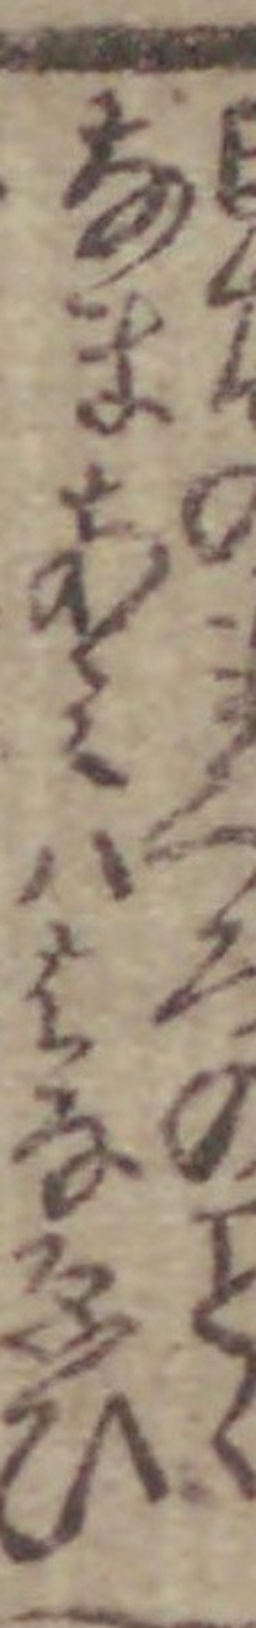なまあみははなゑひ
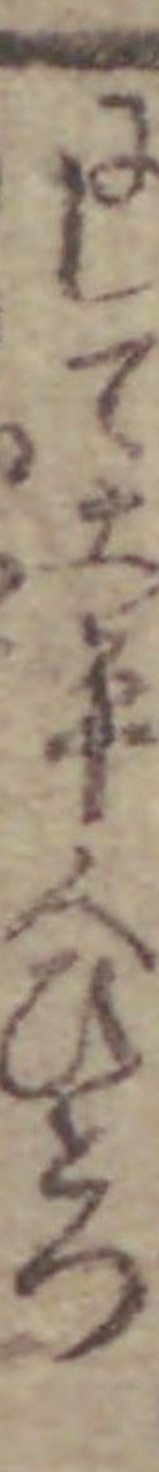にして大平へひとつ
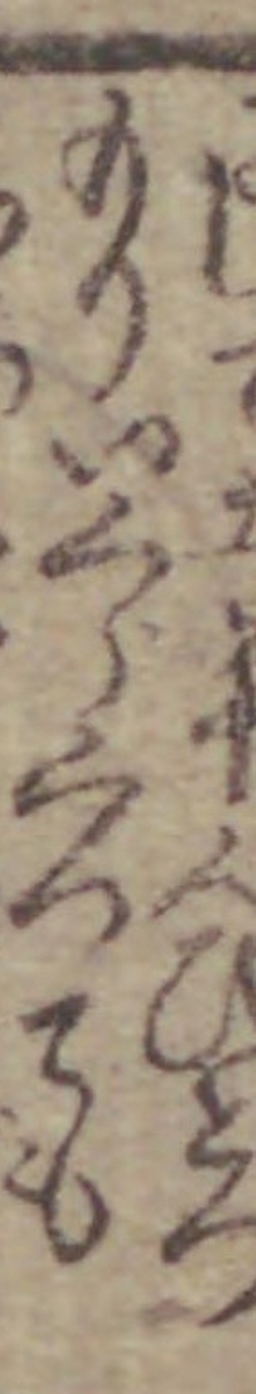もりいくらくつても
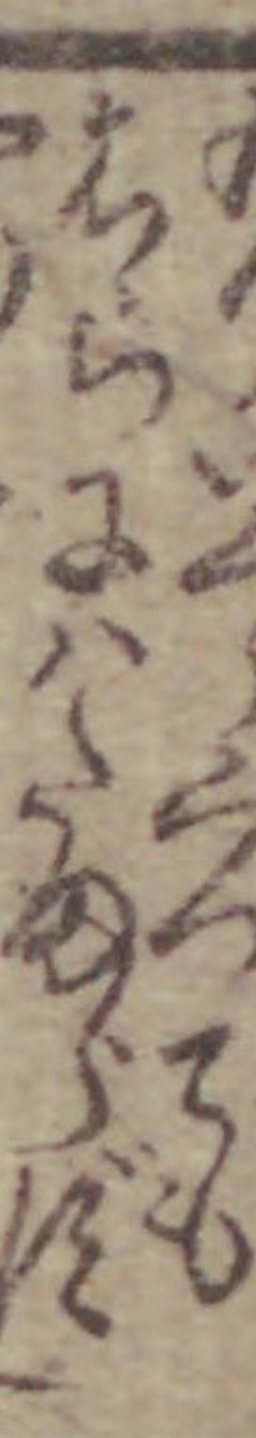はらにはたまらず
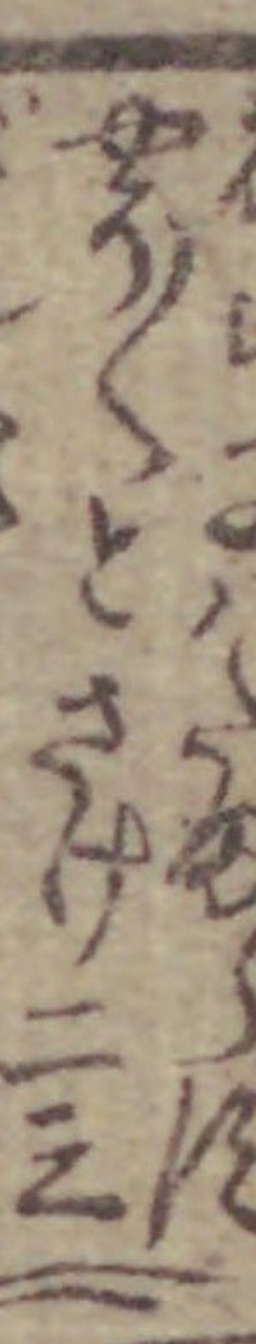やう〳〵とさけ二三
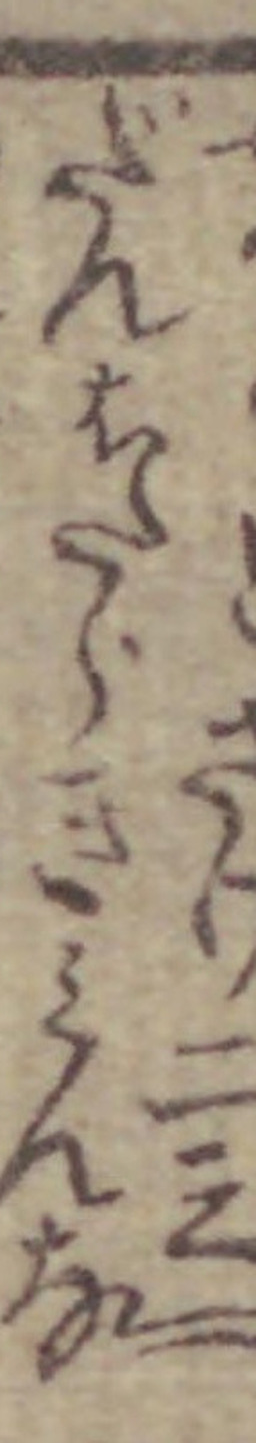だんはたらきみんな
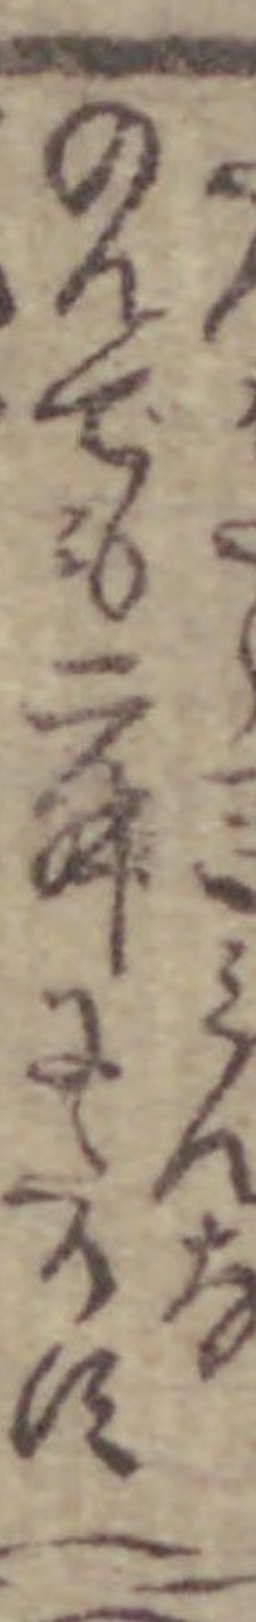のんでも二升にたりす
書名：近頃嶋めぐり 3巻
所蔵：国立国会図書館 National Diet Library, JAPAN
